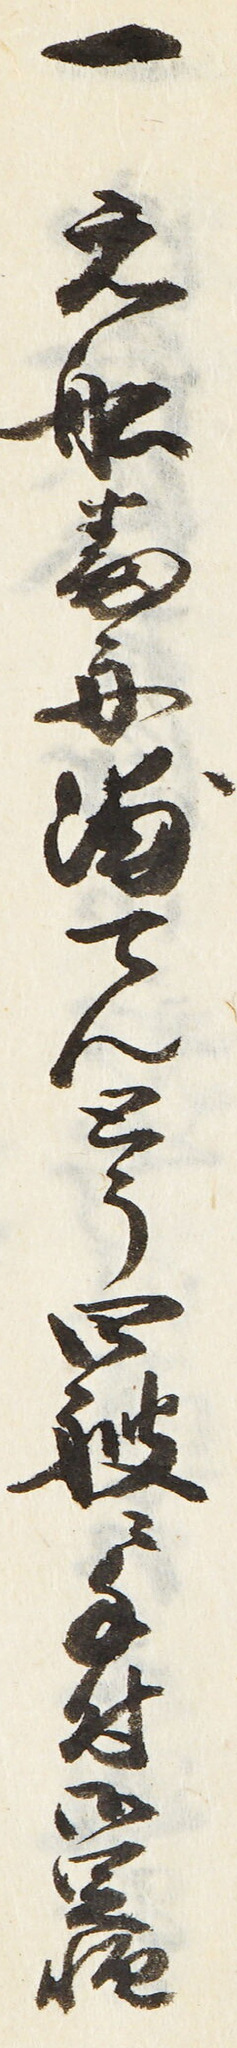一元船番舟浦てんとう四艘ニ手付御足軽
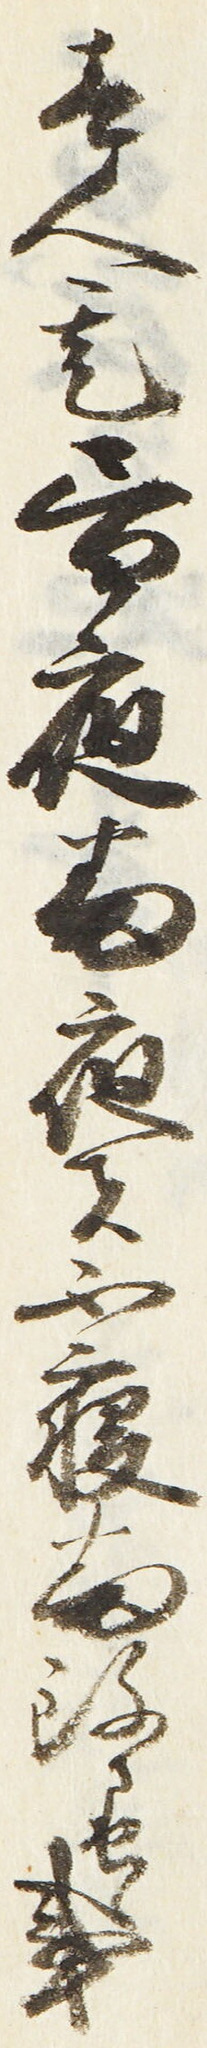壱人充昼夜番夜者不寝番致さセ候事
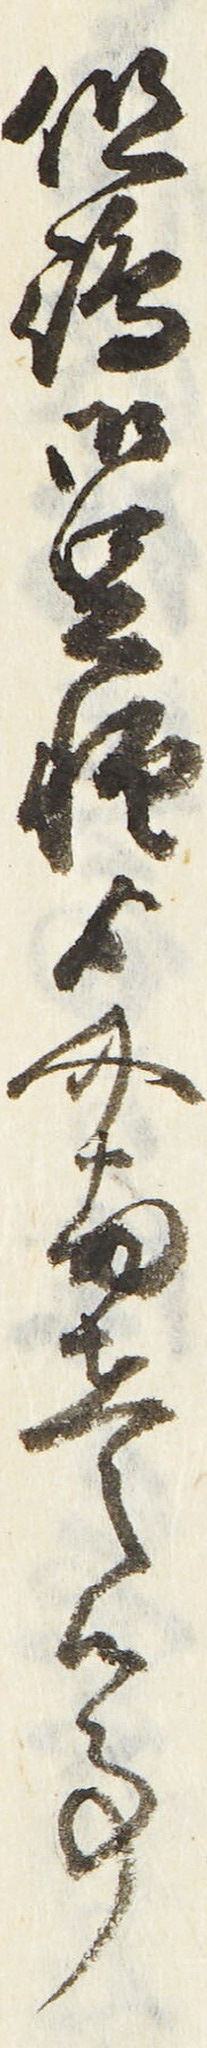但嶋御足軽ゟ介番在之候事

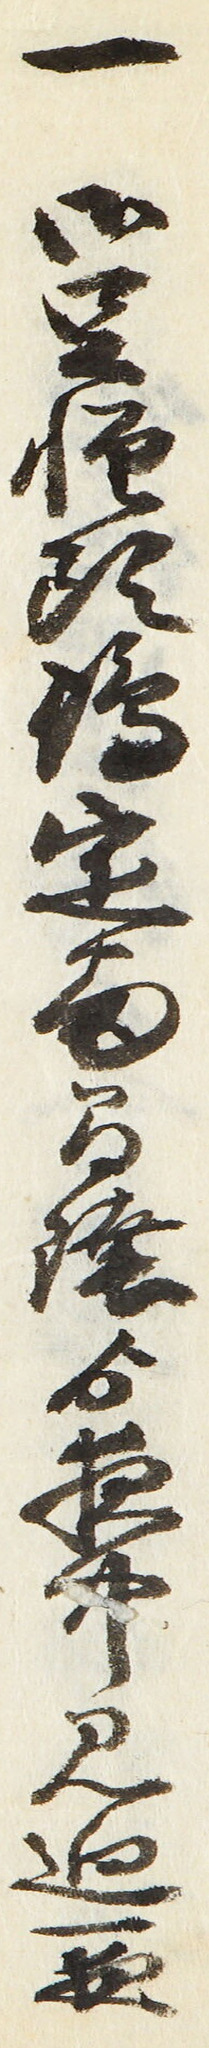一御足軽頭嶋定番間陸ゟ夜中見廻一夜
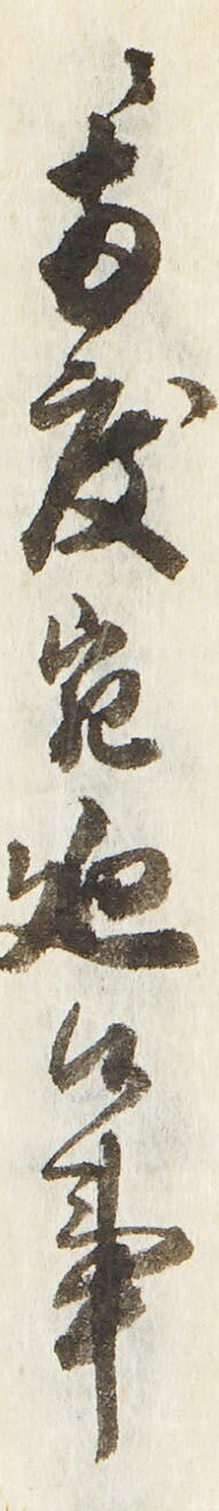ニ両度宛廻候事
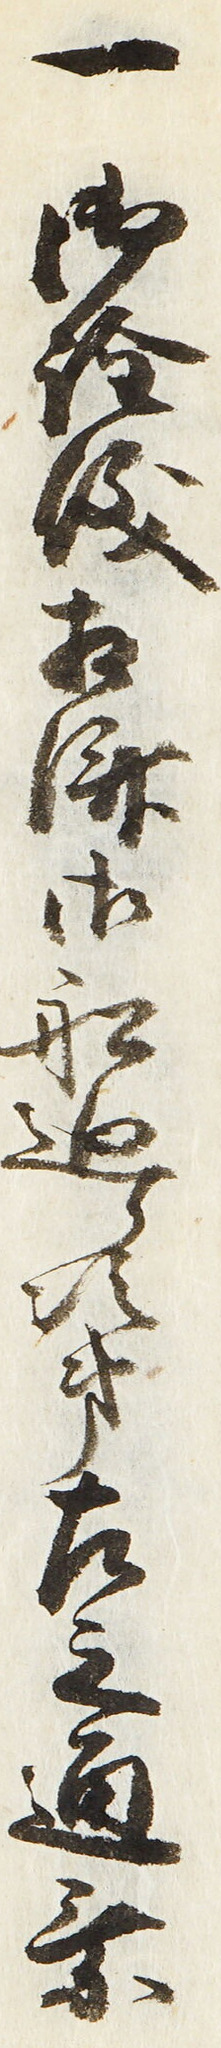一御詮儀相済御船廻り次第左之通乗
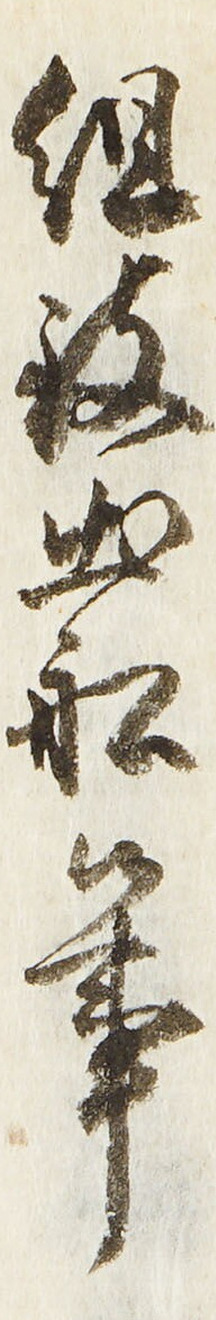組致出船候事
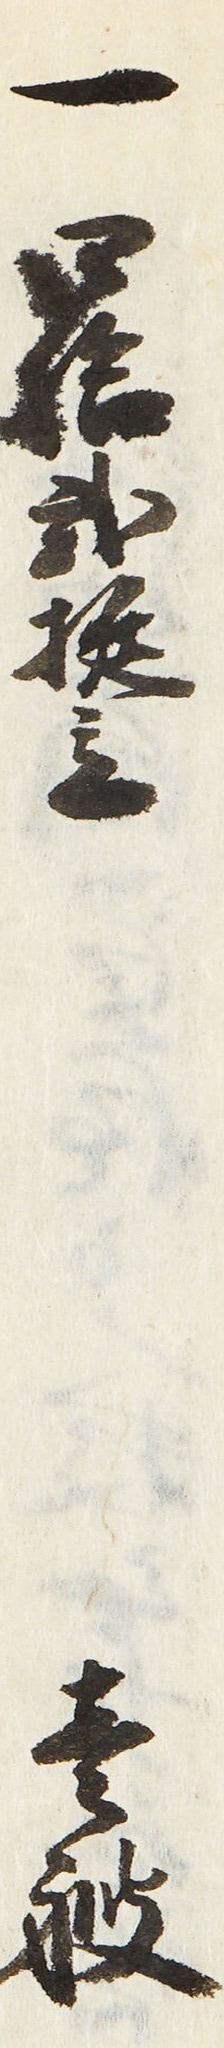一四拾弐挺立壱艘
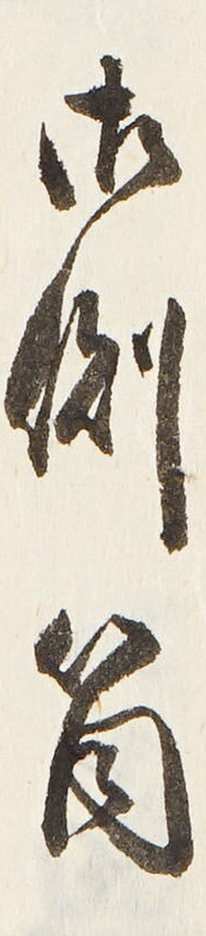御側筒
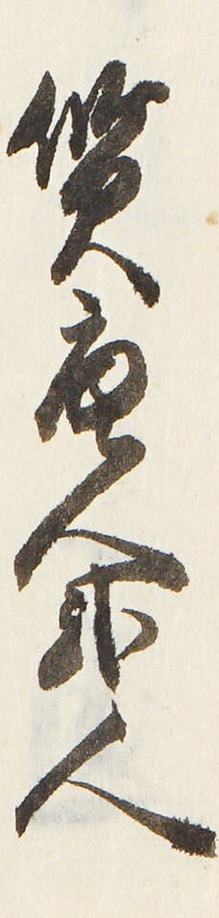質唐人弐人
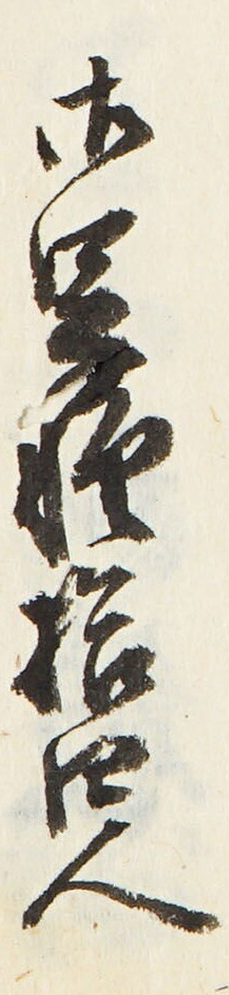御足軽拾四人

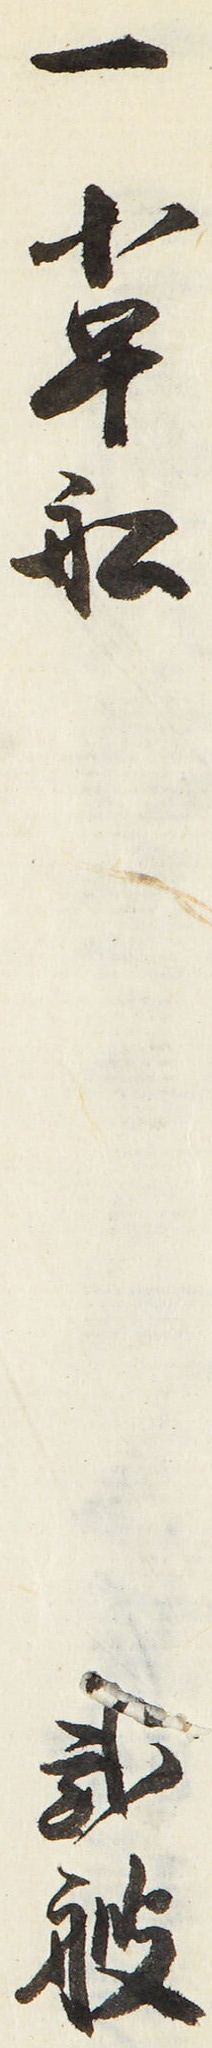一小早船弐艘
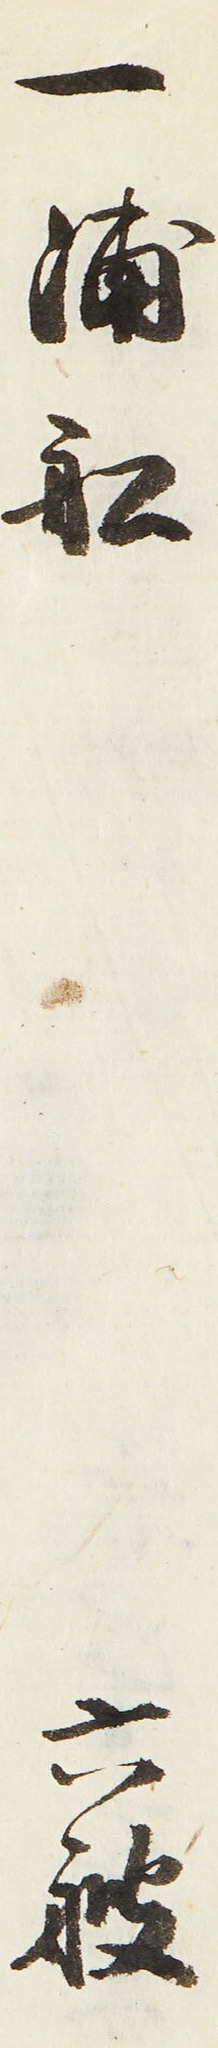一浦船六艘
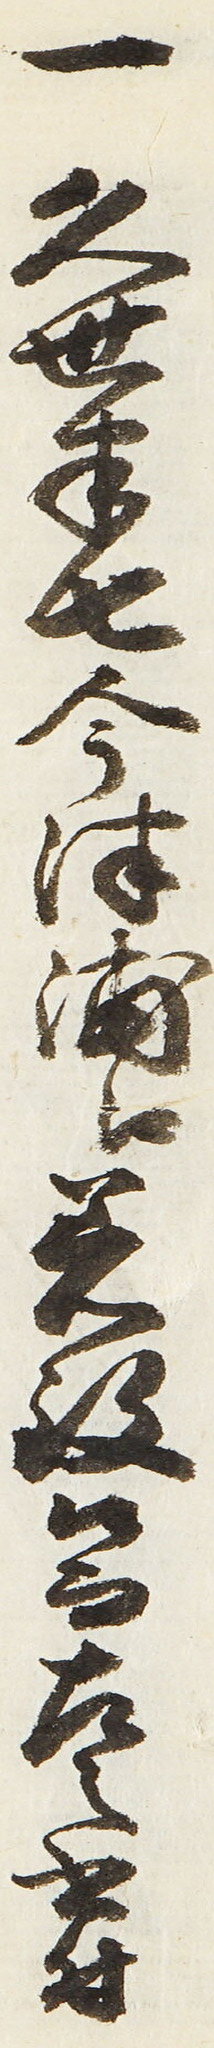一久世半七今津浦江着致候而左之書付
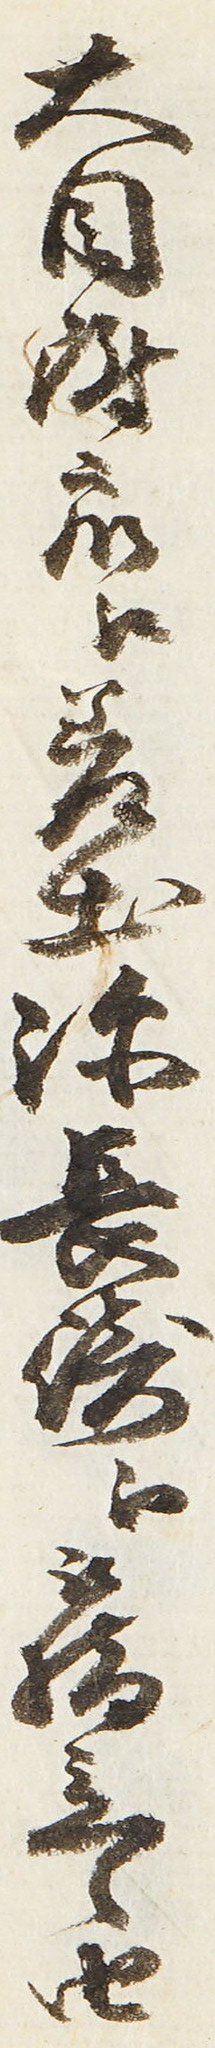大目付衆江差出弥長崎江被指立候由
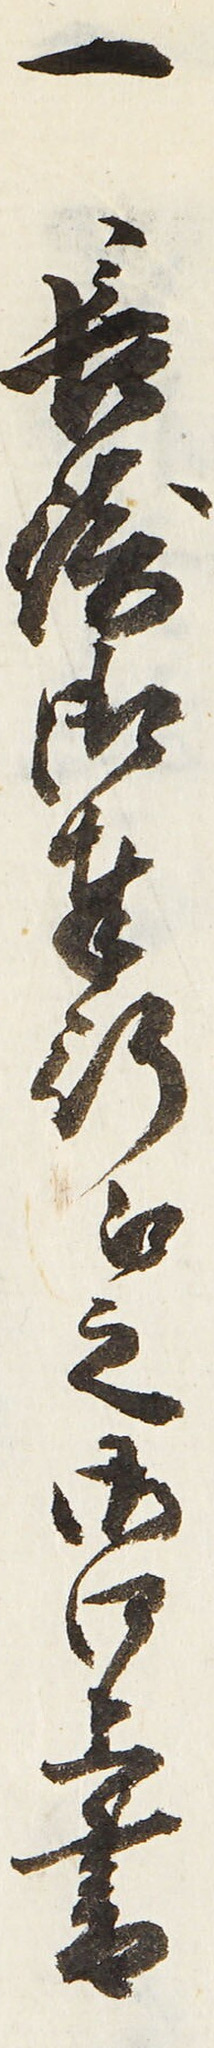一長崎御奉行江之御口上書一通
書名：玄海嶋江漂着船為警固長崎江被越候覚
